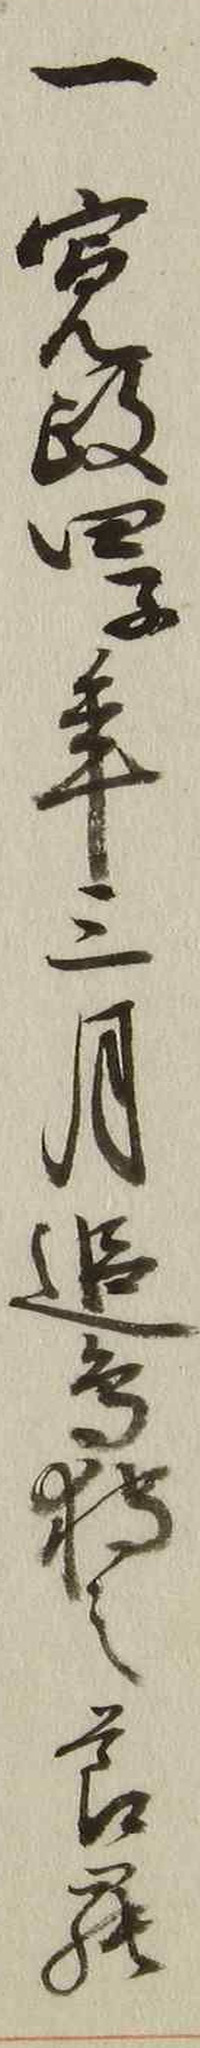一寛政四子年三月追鳥狩之節罷
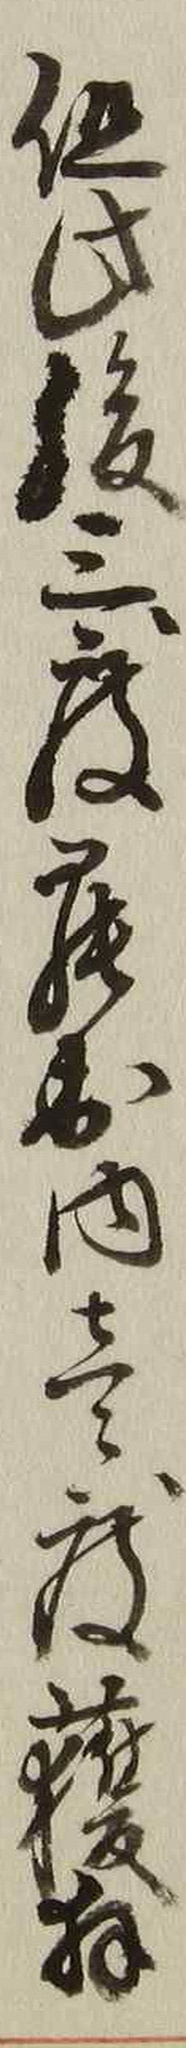但此後三度罷出内壱度獲拝
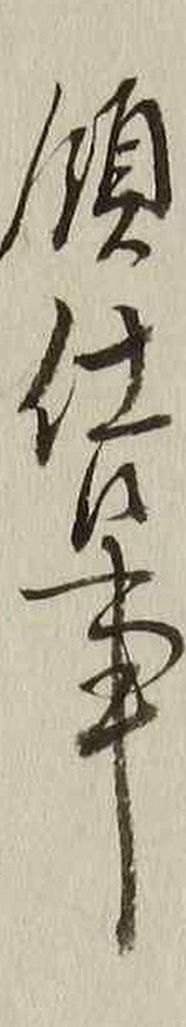領仕候事
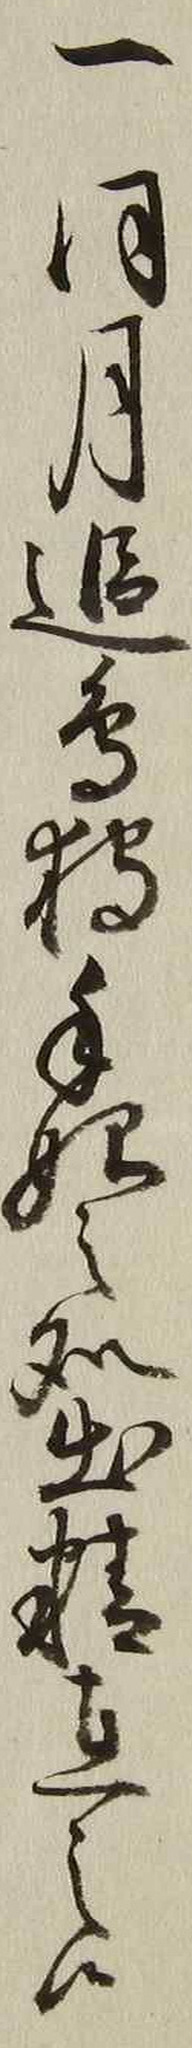一同月追鳥狩手始之処出精在之候
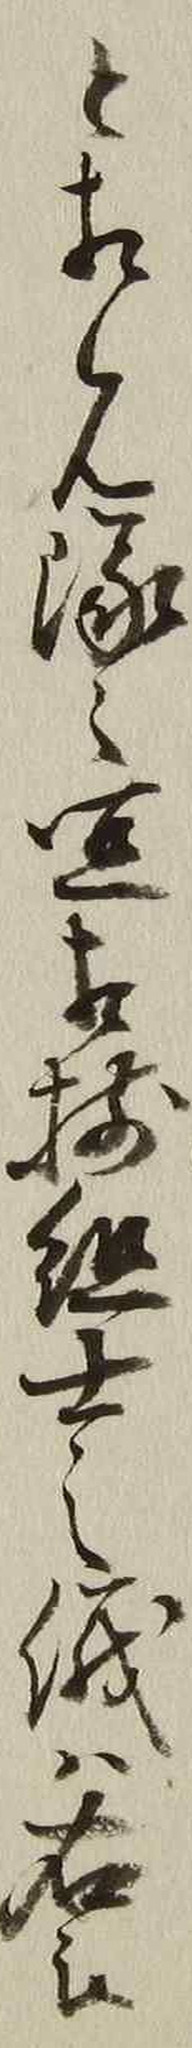と相見隊々宜相揃組士之儀ハ右被
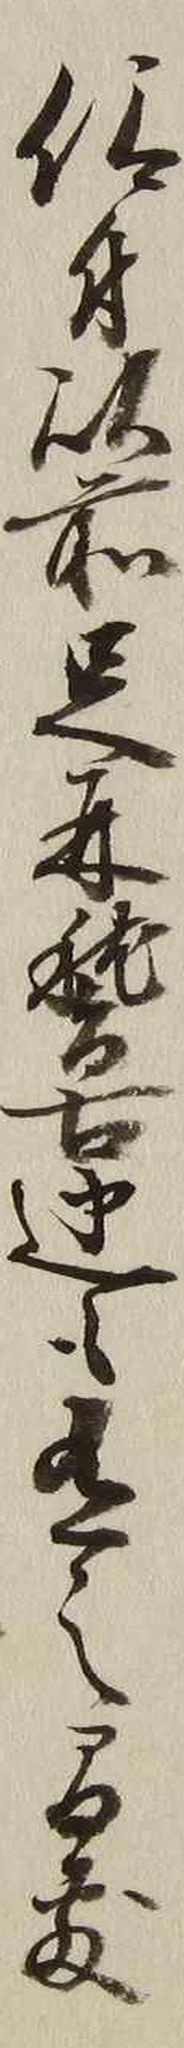仰付以前足并稽古迚も有之間敷
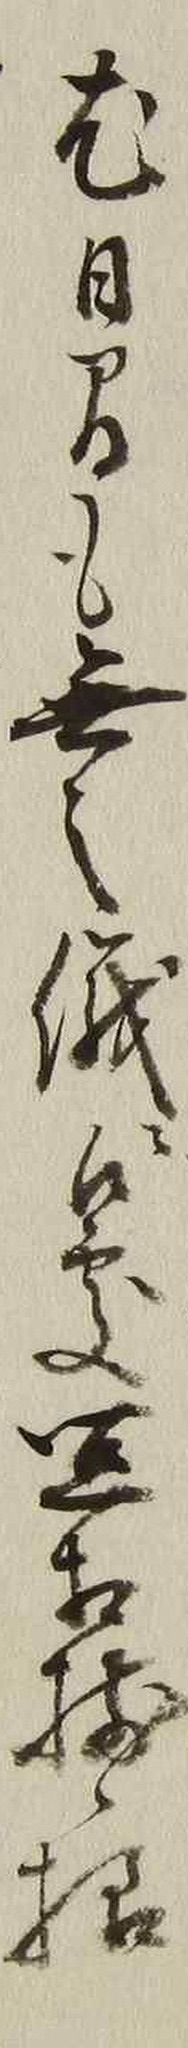尤日間も無之俄ニ候処宜相揃候様
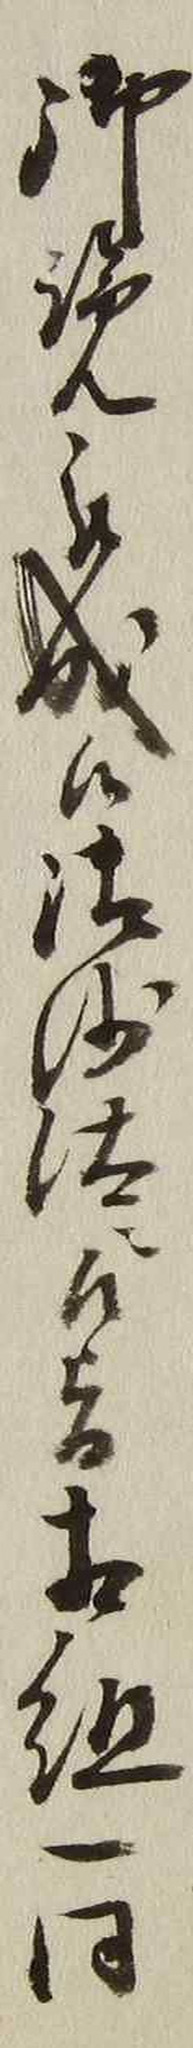御覧被成候御沙汰ニ候旨相組一同
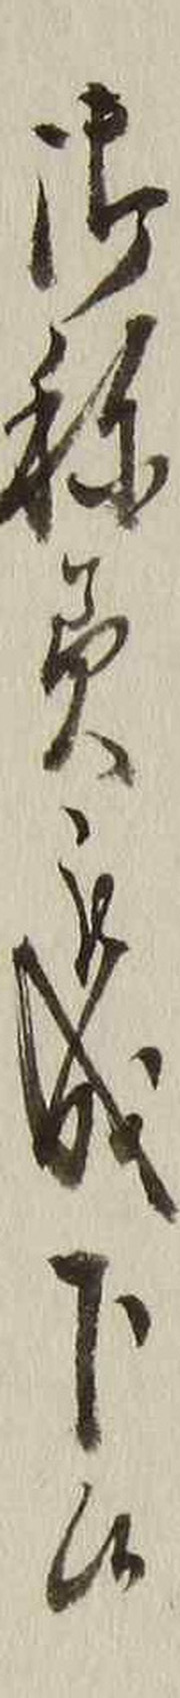御称美被成下候
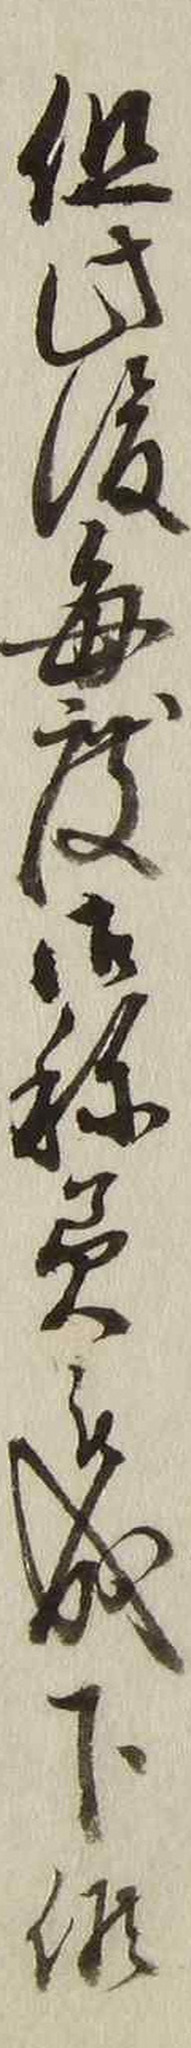但此後毎度御称美被成下候
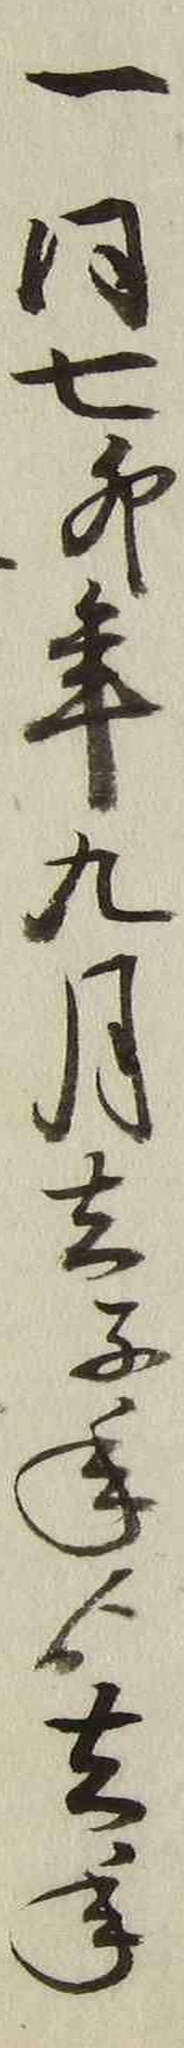一同七卯年九月去子年ゟ去年
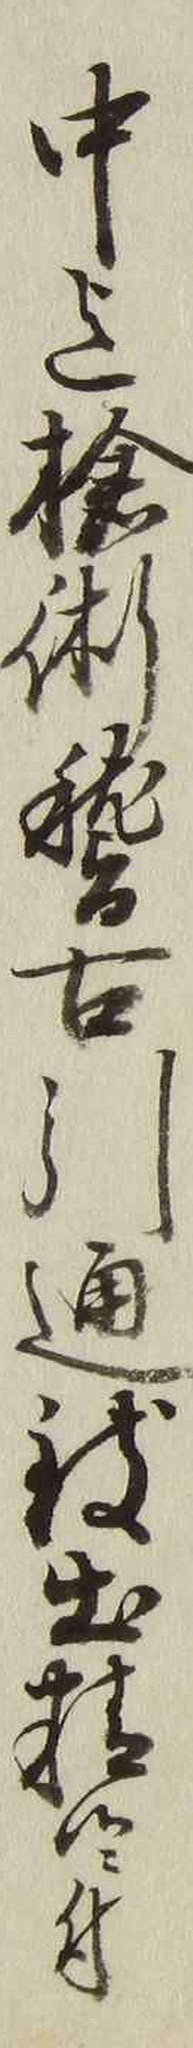中迄槍術稽古引通致出精候ニ付
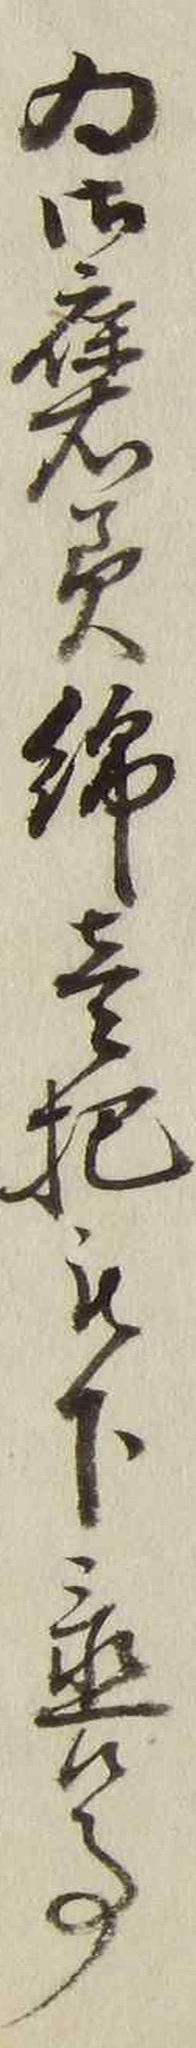為褒御美綿壱把被下置候事

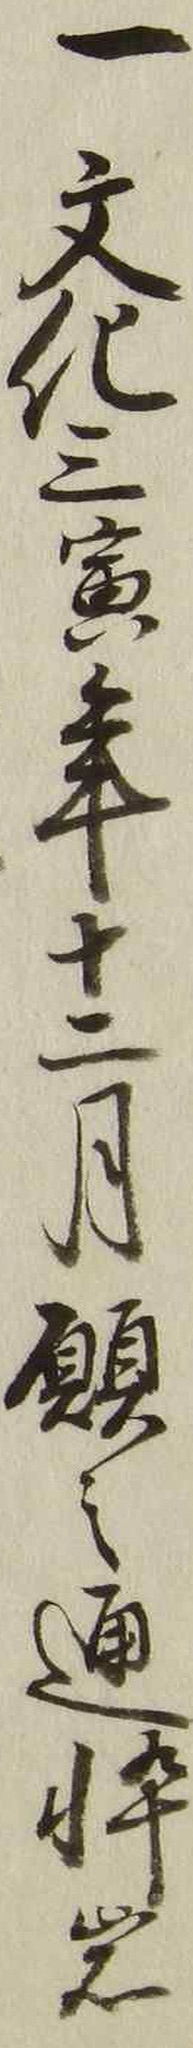一文化三寅年十二月願之通忰岩
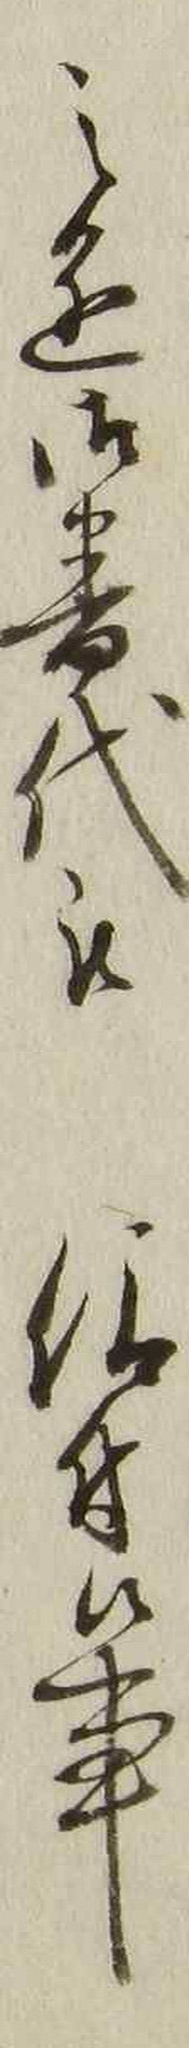之進御番代被仰付候事
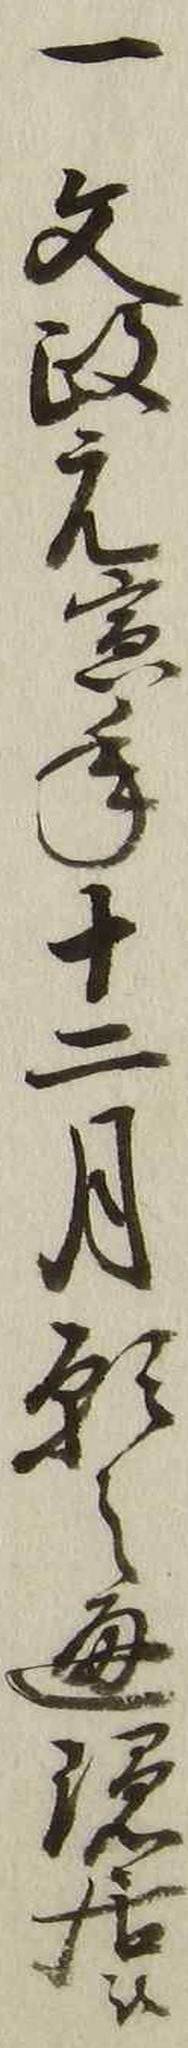一文政元寅年十二月願之通隠居被
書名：諸士系譜　巻之27　い之部27
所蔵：会津若松市立会津図書館
